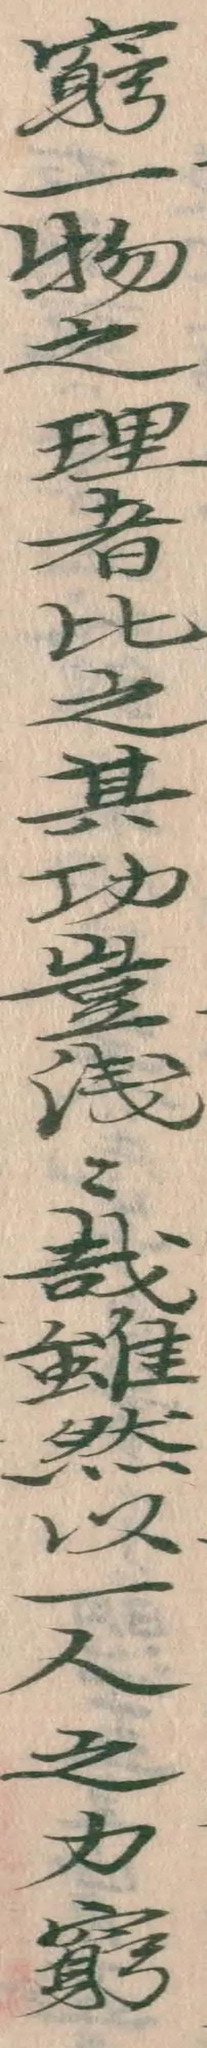窮一物之理者比之其功豈浅々哉雖然以一人之力窮
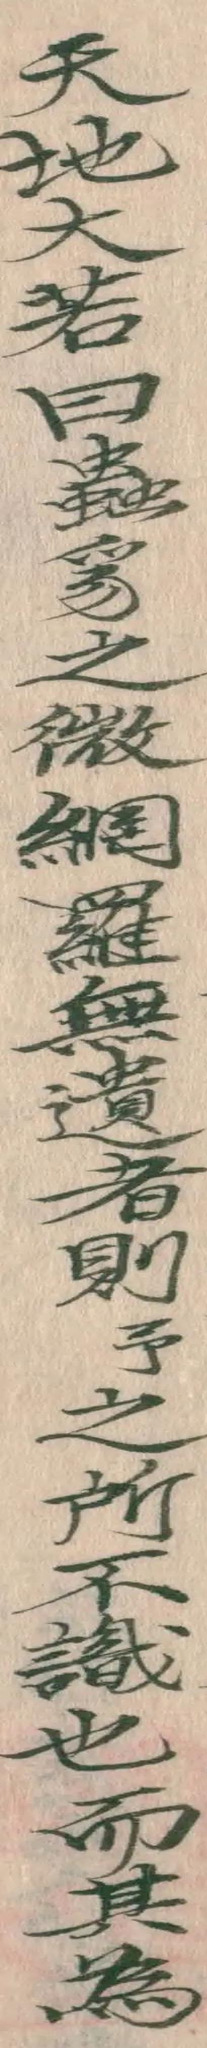天地大若曰蟲豸之微綱羅無遺者則予之所不識也而其為
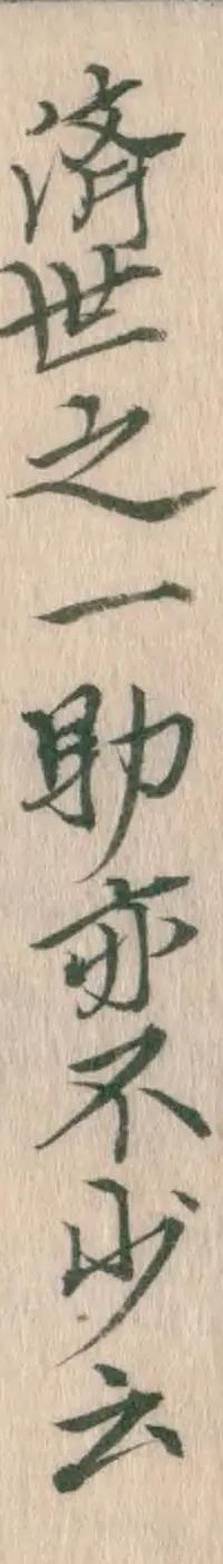済世之一助亦不少云
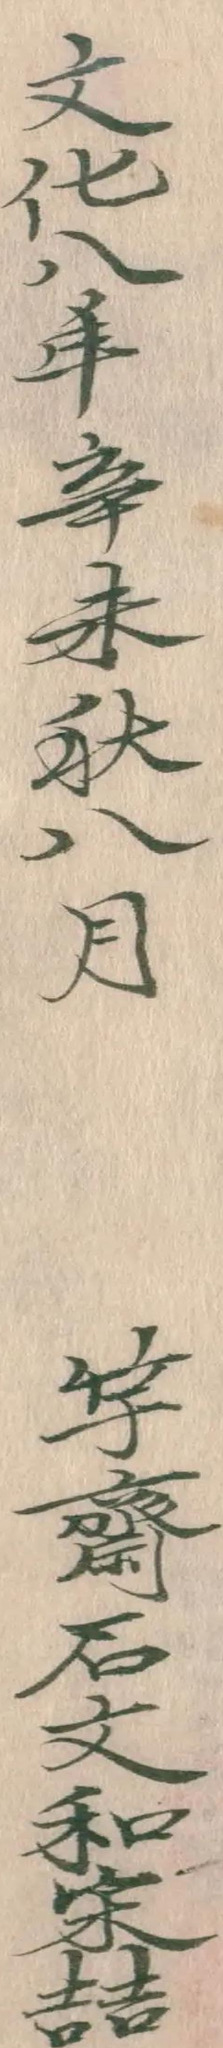文化八年辛未秋八月竿斎石文和宋喆

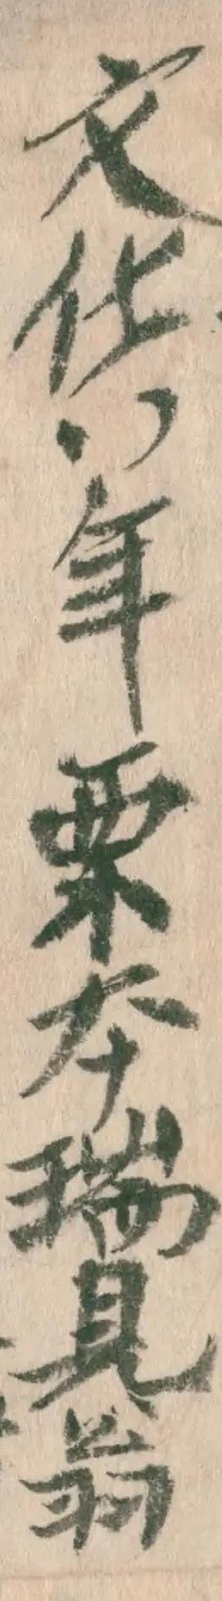文化八年栗本瑞見翁
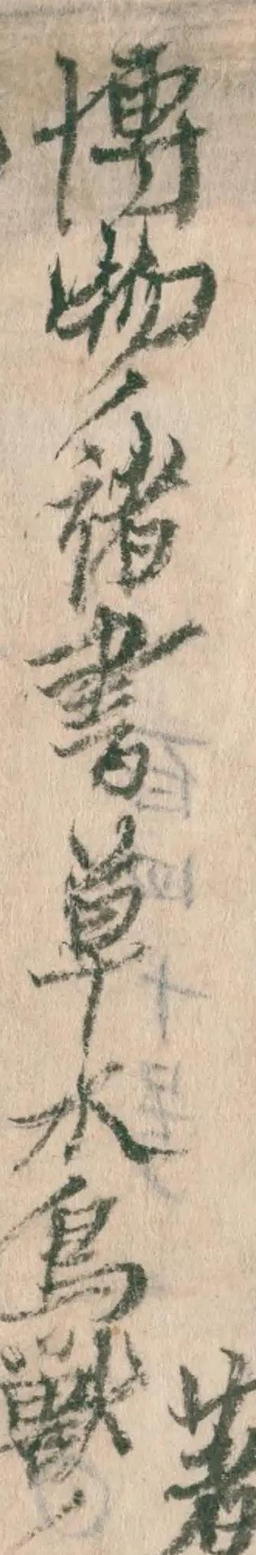博物ノ諸書草木鳥獣ノ
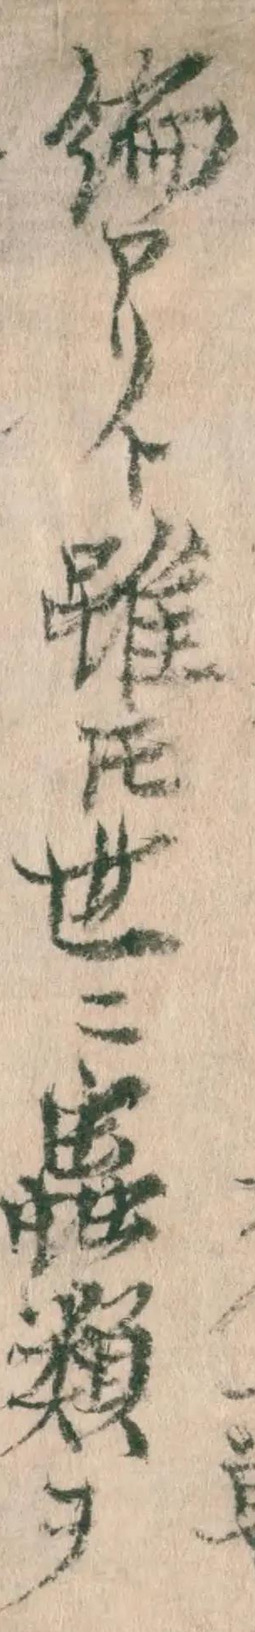編アリト雖トモ世ニ蟲類ヲ
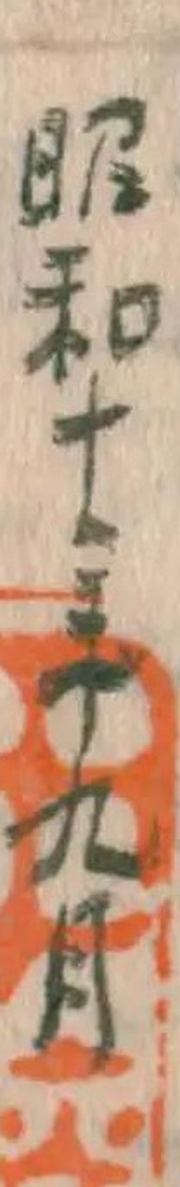昭和十年九月
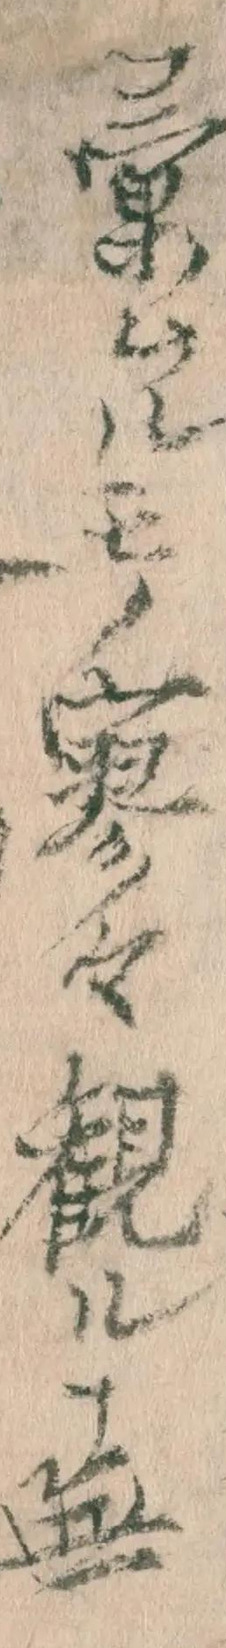彙ムルモノ寥々観ルコト無
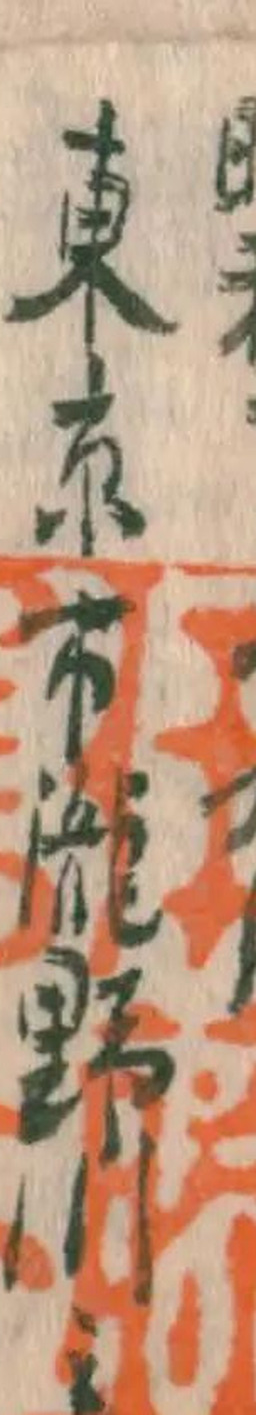東京市瀧野川之
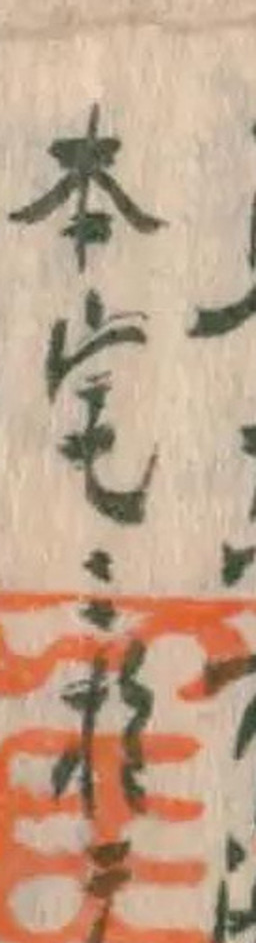本宅ニ於テ
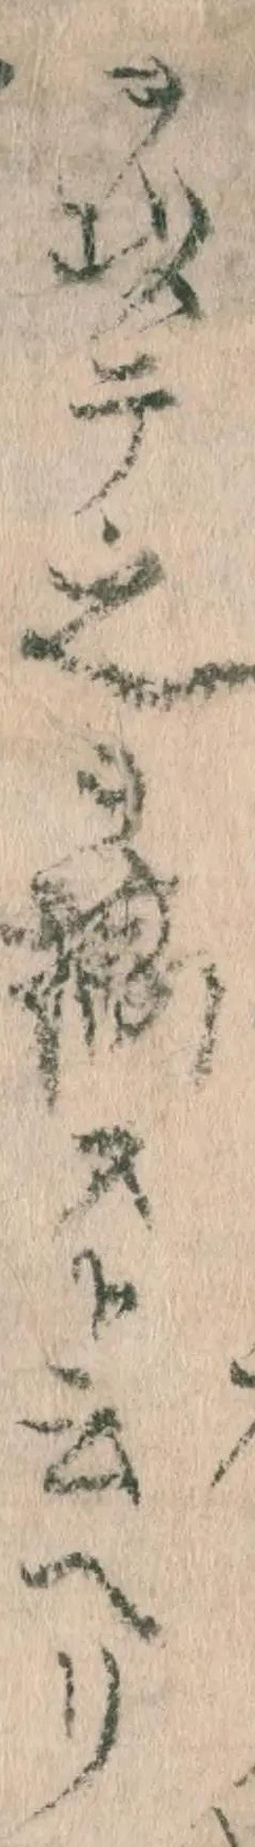ヲ以テ之ヲ稿スト云ヘリ
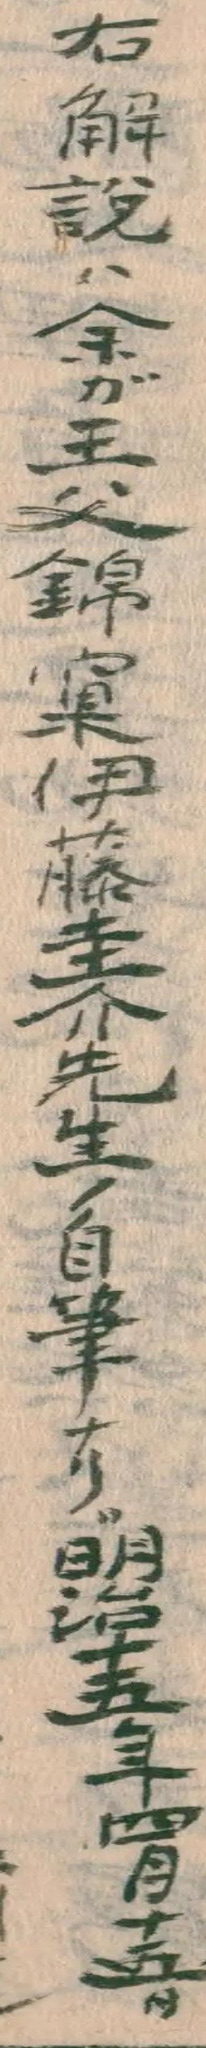右解説ハ余ガ王父錦窠伊藤圭介先生ノ自筆ナリ。明治十五年四月十五六日
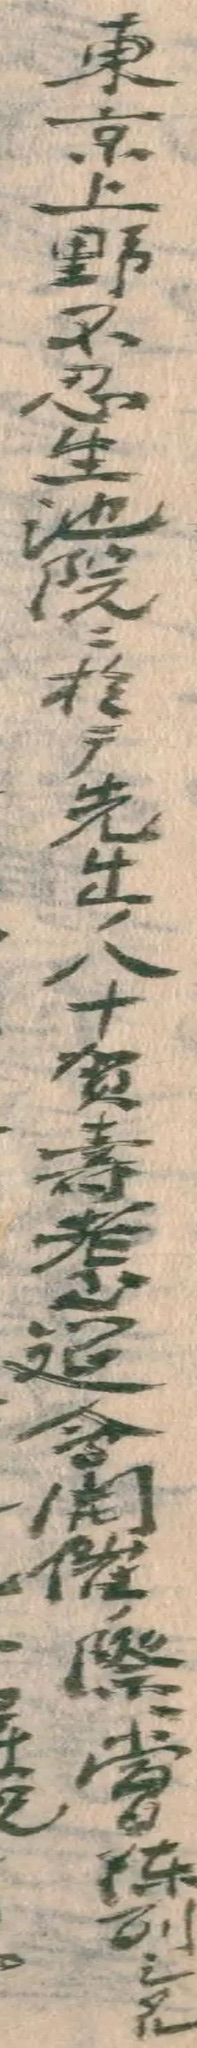東京上野不忍生池院ニ於テ先出ノ八十賀寿耋筵會開催ノ際ニ嘗陳列シタル
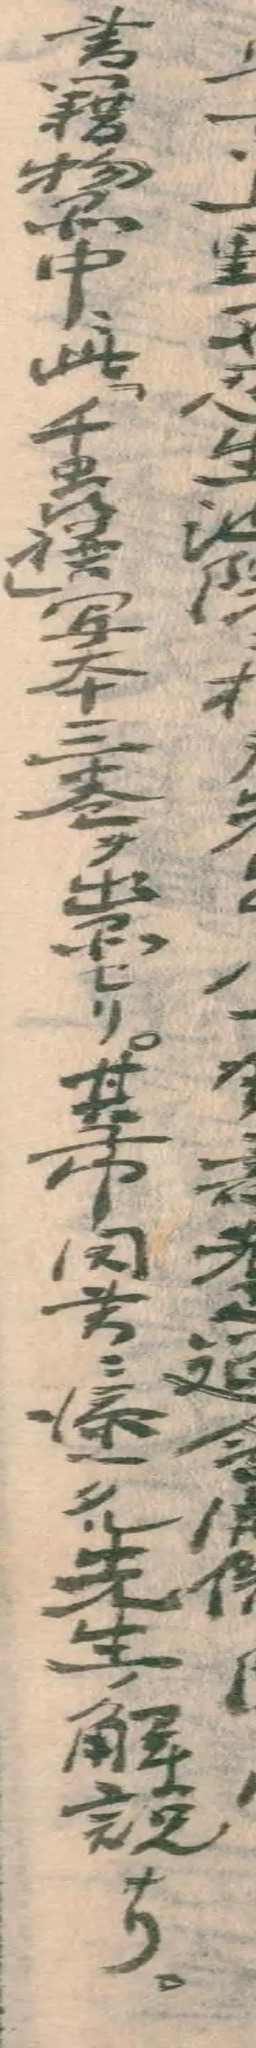書籍物品中ニ此「千蟲譜」写本三巻ヲ出品セリ。其市同書ニ添ヘタル先生ノ解説ナリ。

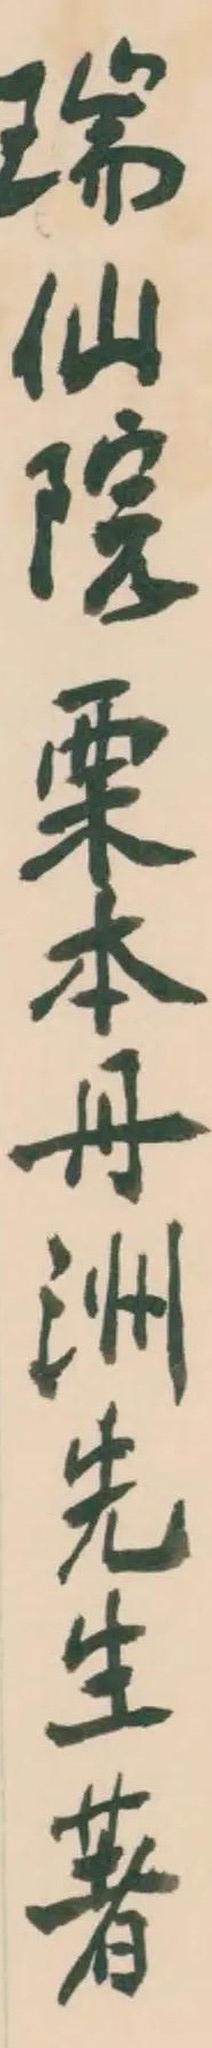瑞仙院栗本丹洲先生著
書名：千蟲譜 3巻. [3]
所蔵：国立国会図書館 National Diet Library, JAPAN
